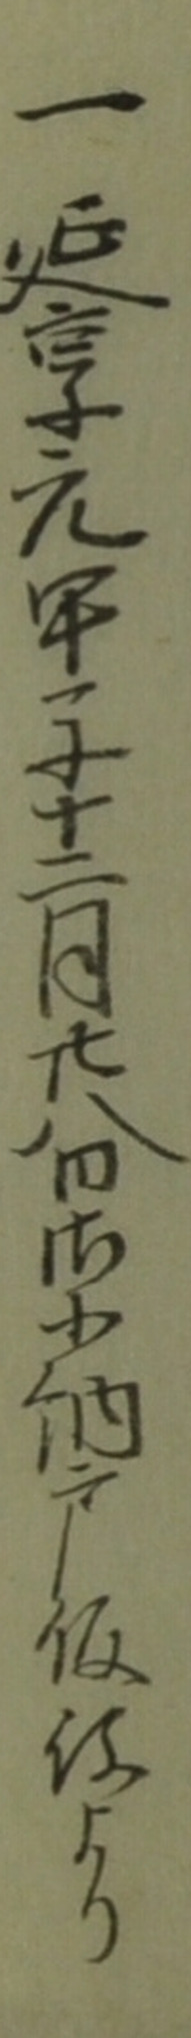一延享元甲子十二月廿八日御小納戸仮役より
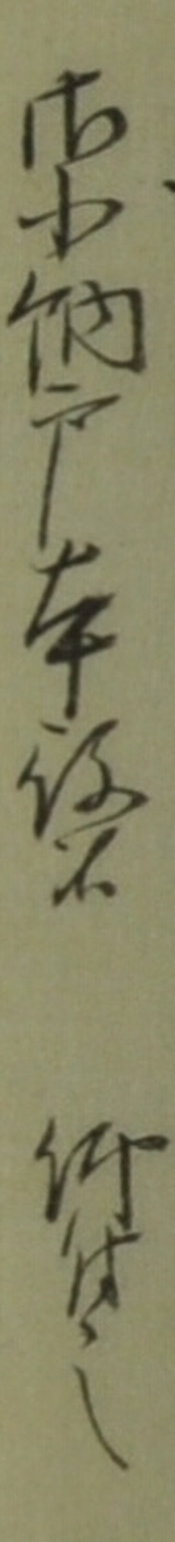御小納戸本役被仰付之

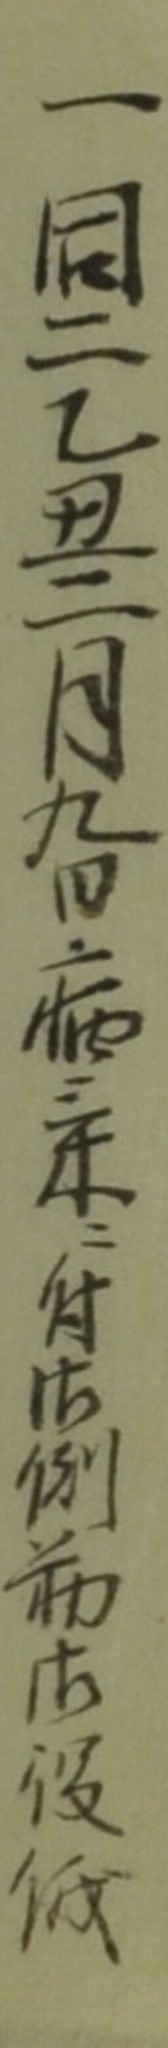一同二乙丑二月九日病気ニ付御側勤御役儀
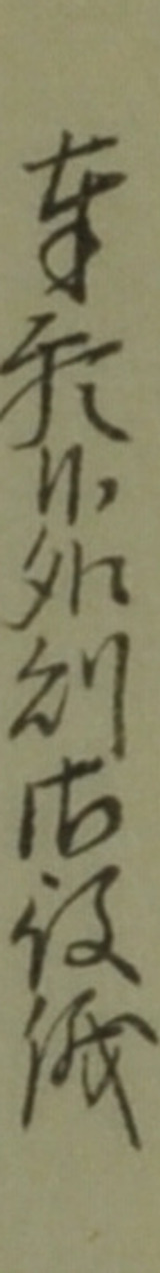奉願候処則御役儀
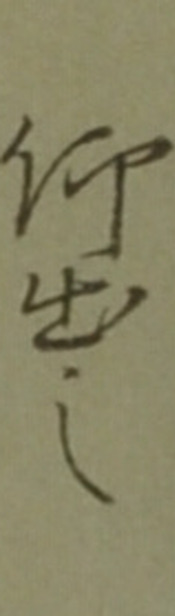仰出之
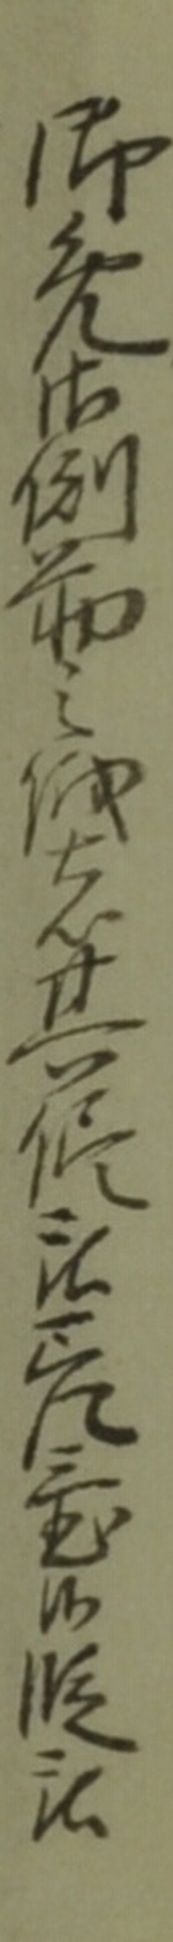御免御側勤之儀者其侭ｈ被差置候段被
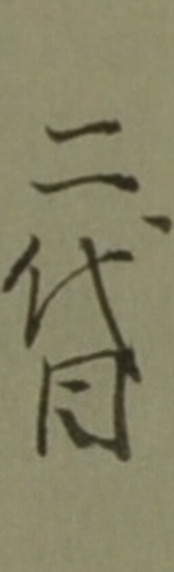二代目
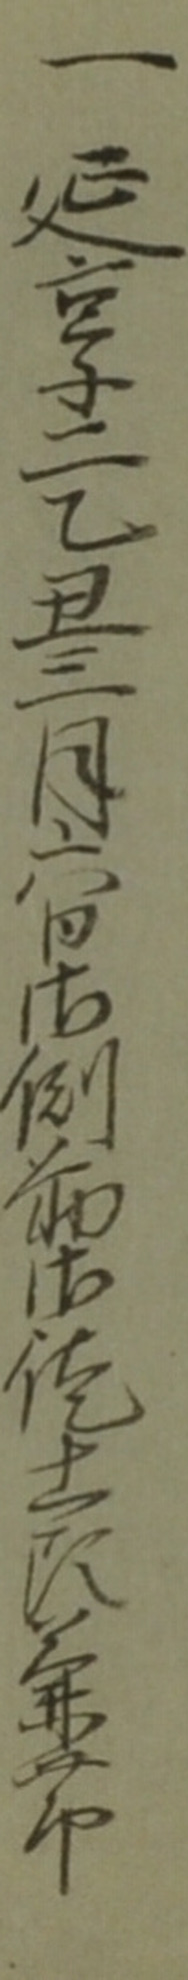一延享二乙丑三月六日御側勤御徒士頭兼帯
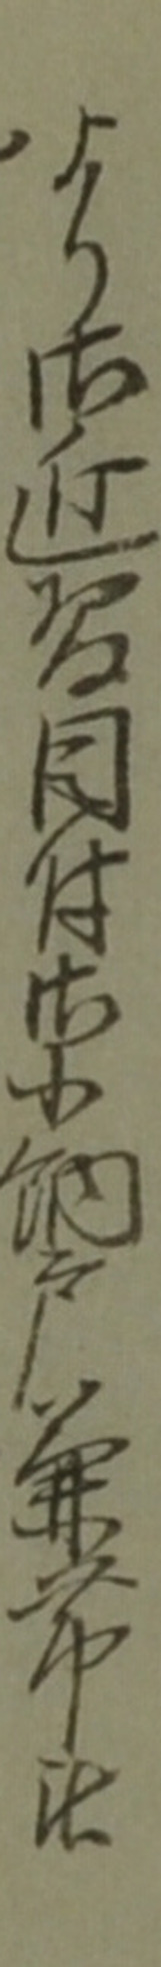より御近習目付御小納戸兼帯被
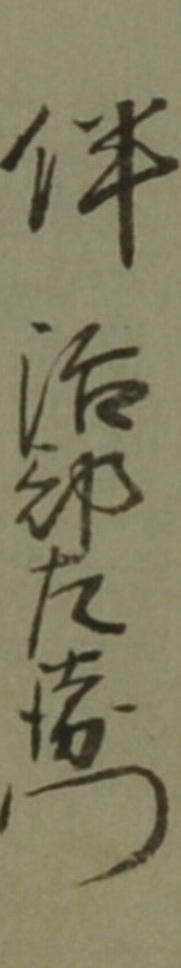伴治部左衛門
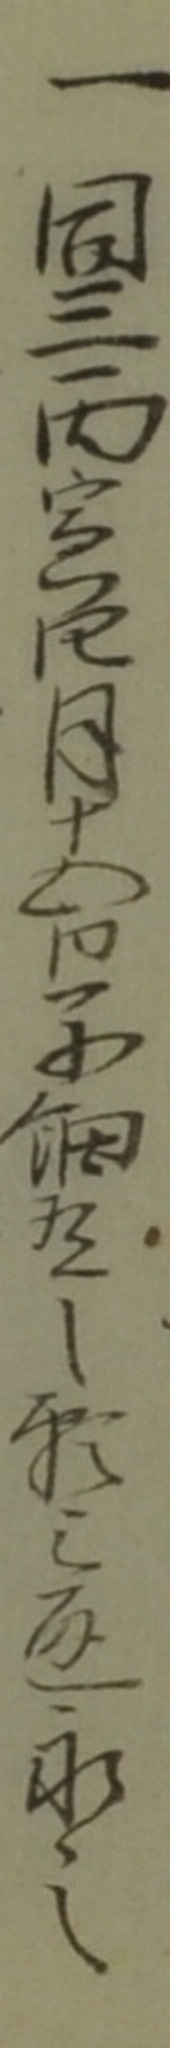一同三丙寅四月十五日子細有之願之通永之
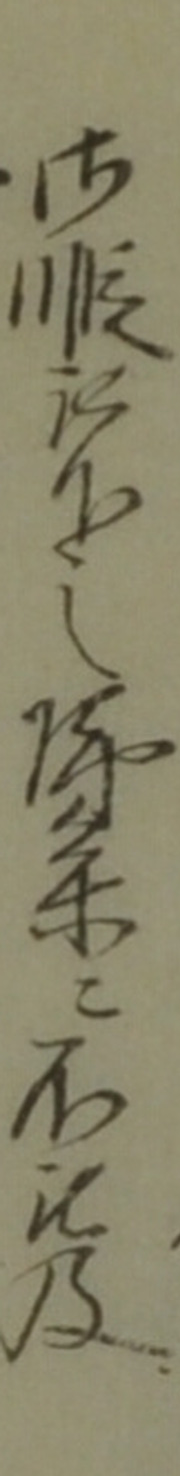御暇被下之帰参ニ不被及
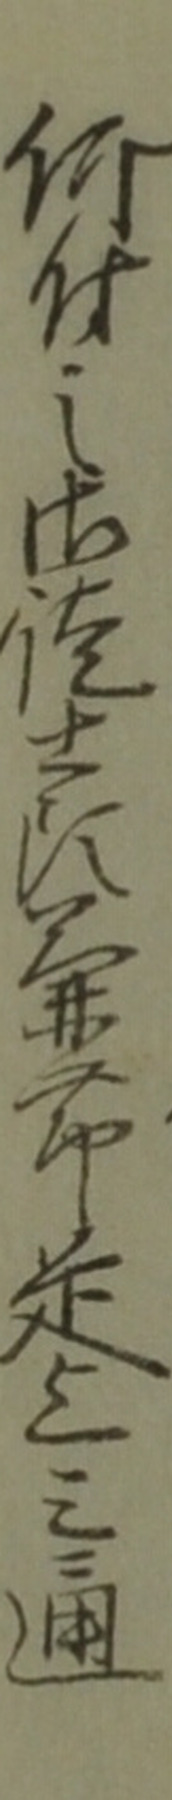仰付之御徒士頭兼帯是迄之通
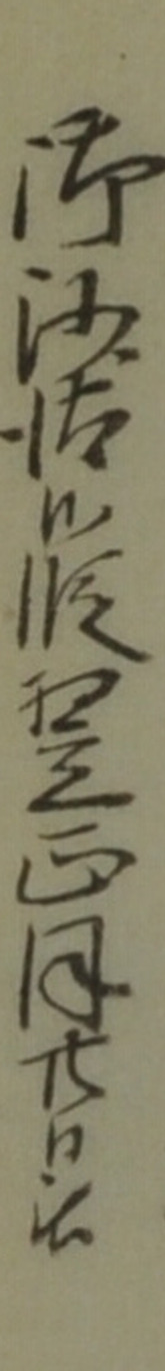御沙汰候段翌正月廿日被仰出之
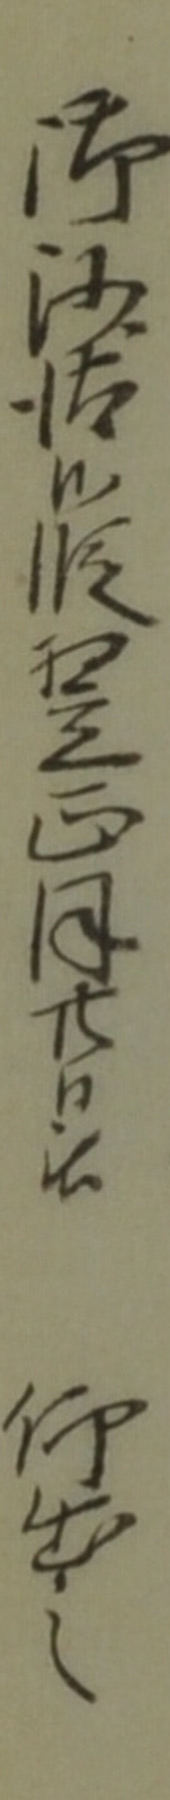御沙汰候段翌正月廿日被仰出之
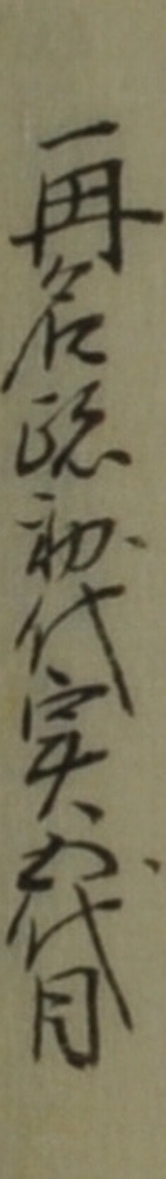再名跡初代実五代目
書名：諸御役代々録（四）
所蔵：伊那市立高遠町図書館・合同会社AMANE
